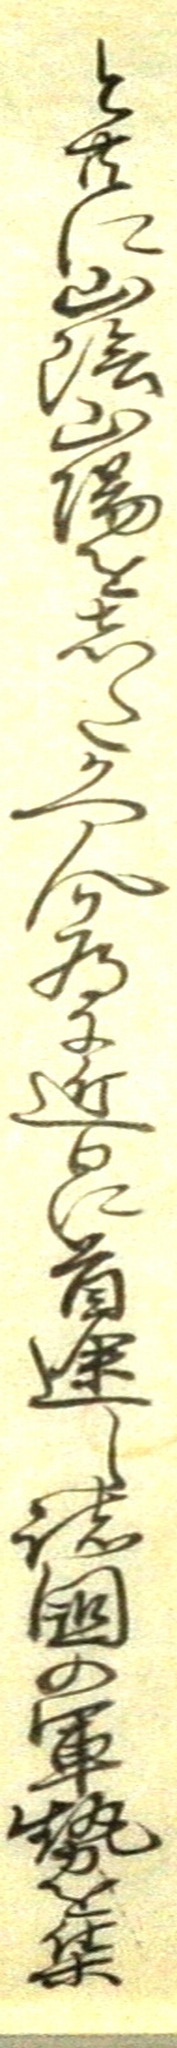と共に山陰山陽をしたかへんか為に近日に首途し諸国の軍勢を集
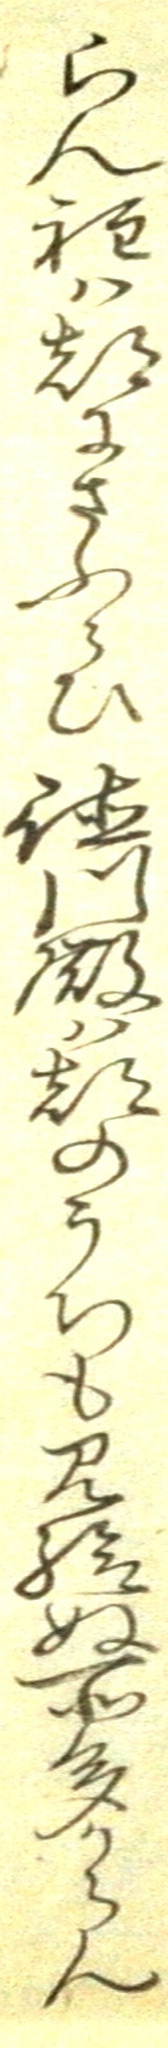候はん程は都にさふらひ徳川殿は都のうちも見給ぬ所多からん
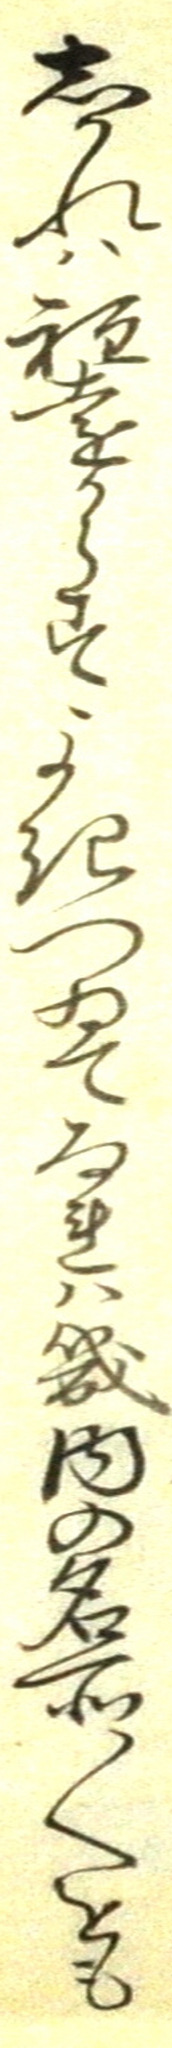しかれは程遠からすよきつゐてなれは畿内の名所〳〵をも
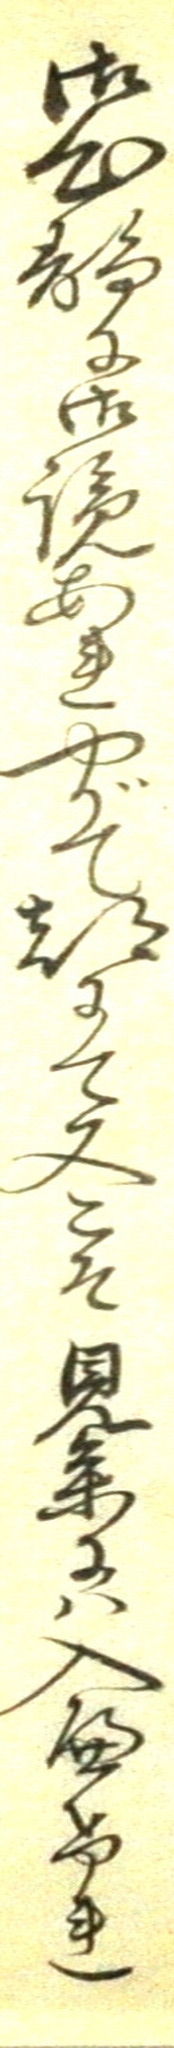御心静に御覧あれやがて都にて又こそ見参には入へけれ
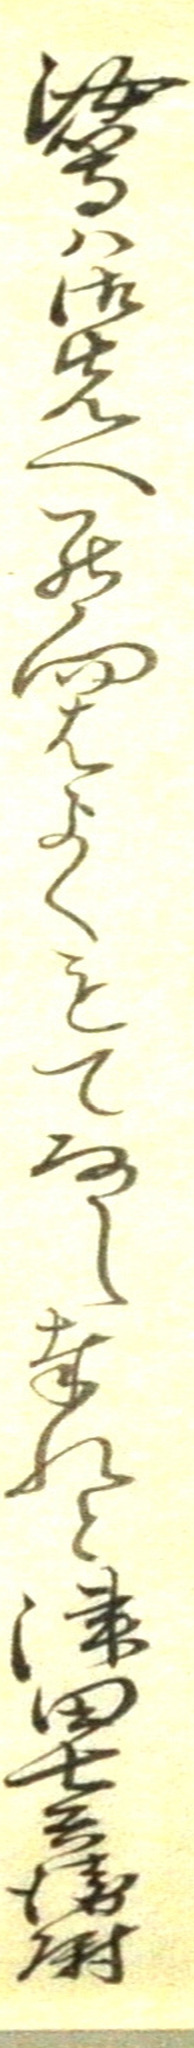汝等は御先へ罷向はよくもてなし奉れと津田七兵衛尉
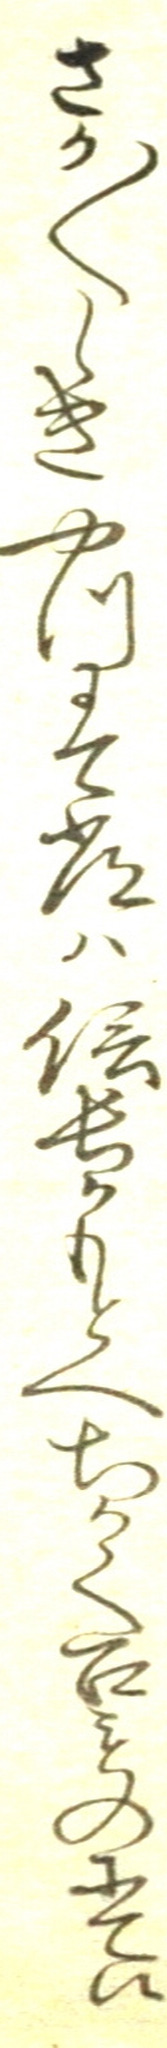さか〳〵しきやつにて常は信長かもとへちかく召ものにて候
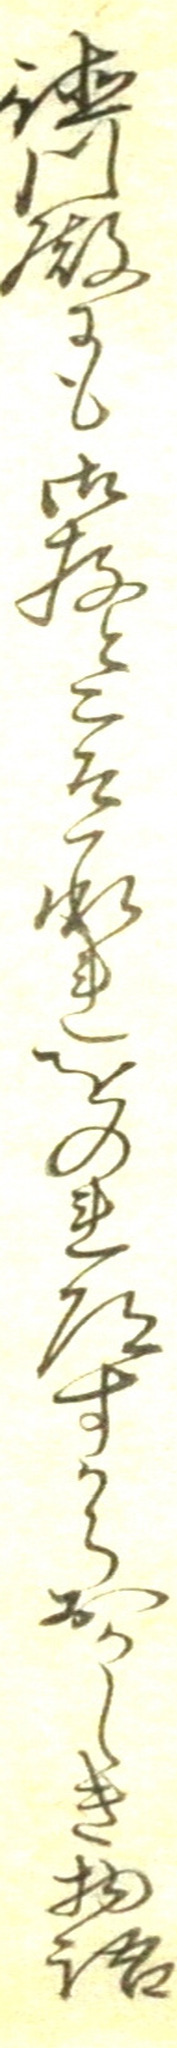徳川殿にも御存とこそ承れをのれ道すからおかしき物語
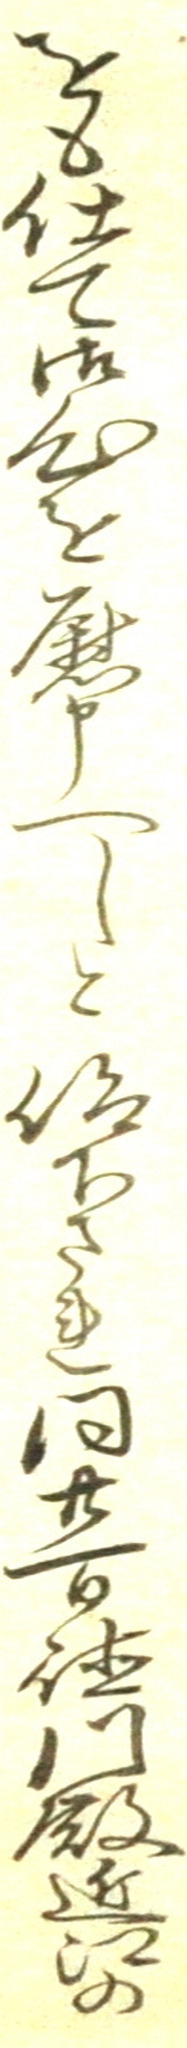をも仕て御心を慰申へしと仰下され同廿一日徳川殿近江の
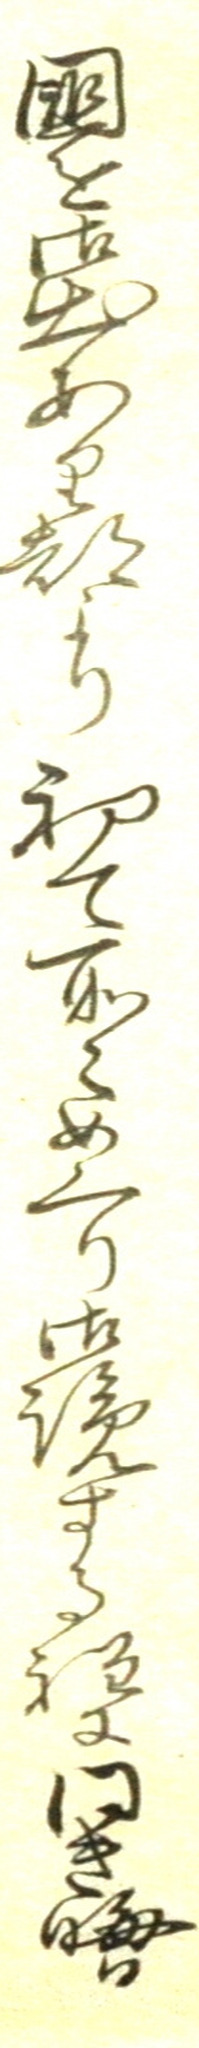国を御出あり都より初て所々めくり御覧する程に同き晦日
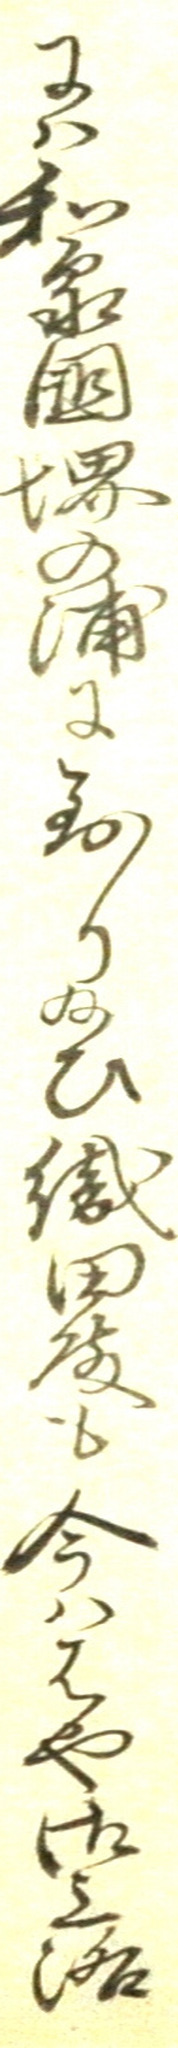には和泉国堺の浦に到り給ひ織田殿もいまははや御上洛
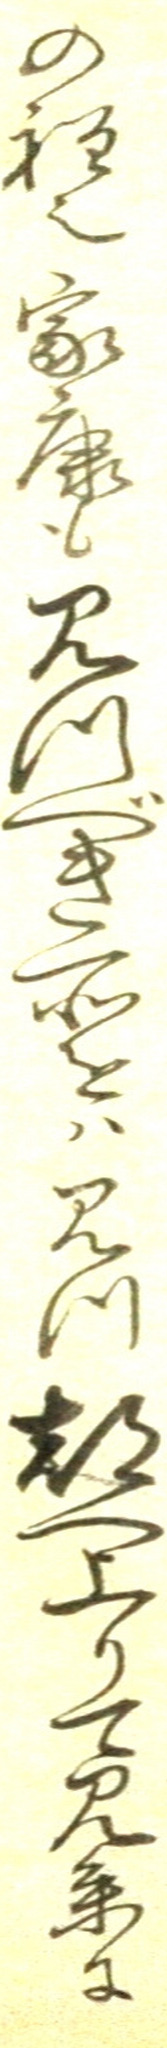の程也家康も見つべき所をは見つ都へ上りて見参に
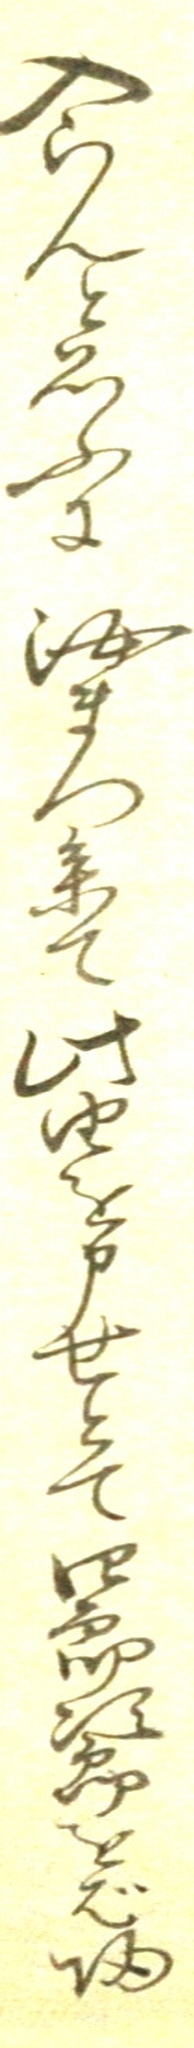入らんと思ふに汝まつ参て此由を申せとて四郎次郎をば帰
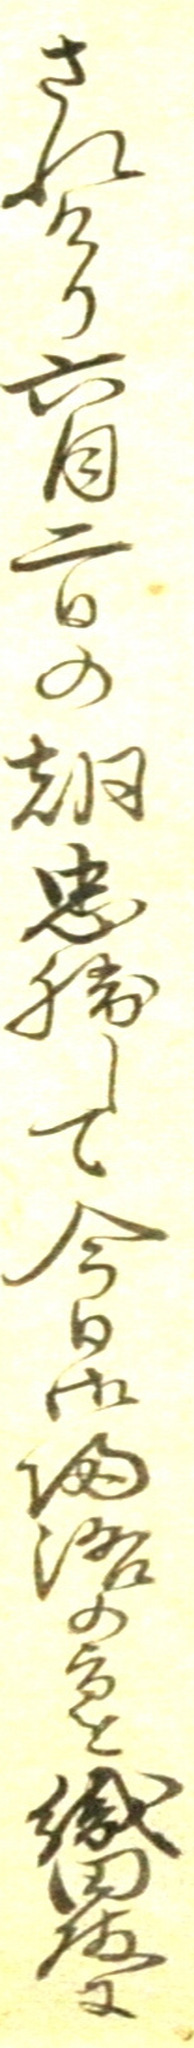されけり六月二日の朝忠勝して今日御帰洛の旨を織田殿に
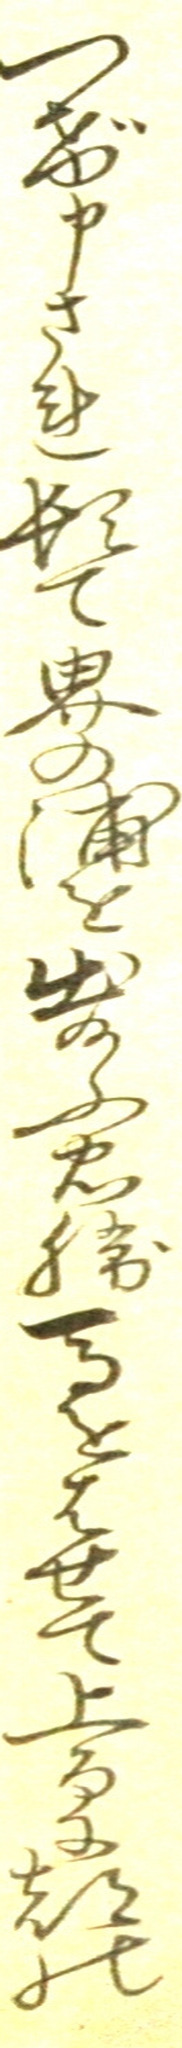つげ申され頓て界の浦を出給ふ忠勝馬をはせて上るに都の

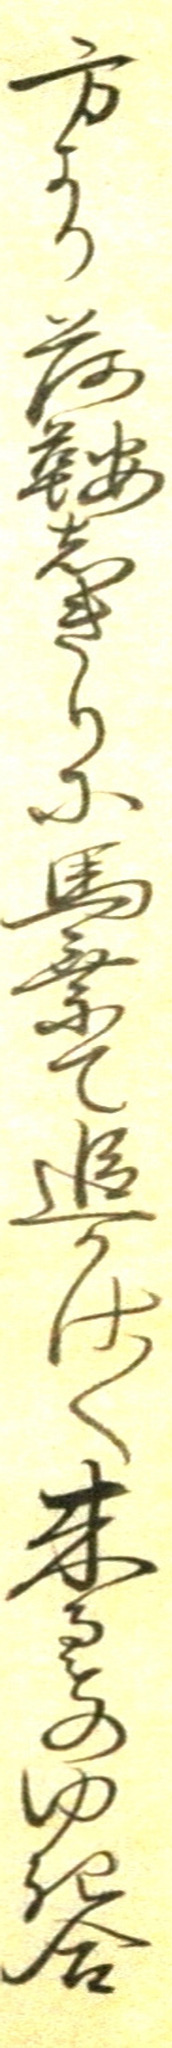方より落鞍しきりに馬乗て追かけ〳〵来るものゆき合
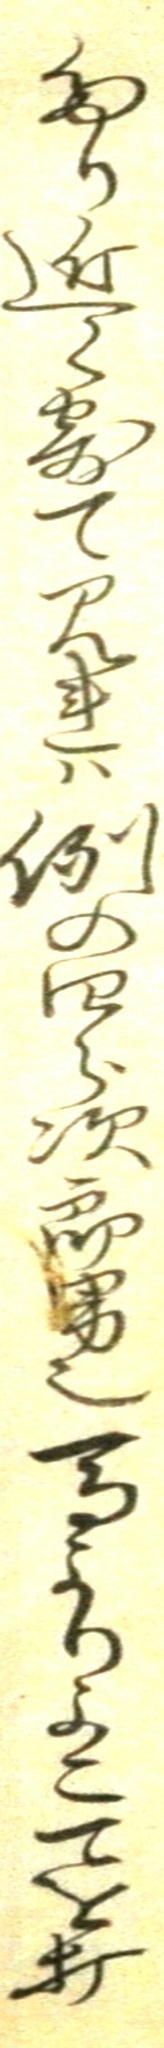たり近く寄て見れは例の四郎次郎男也馬よりよこてを打
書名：藩翰譜（四・上）
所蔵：伊那市立高遠町図書館・合同会社AMANE
